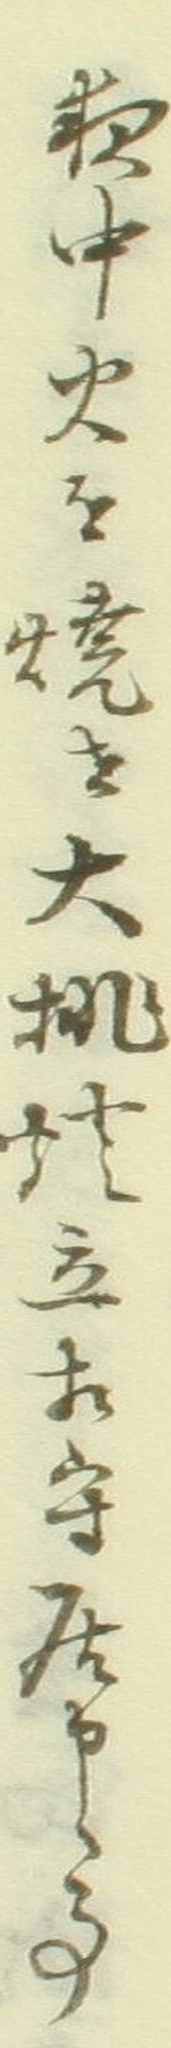夜中火を焼せ大挑燈立相守居申事
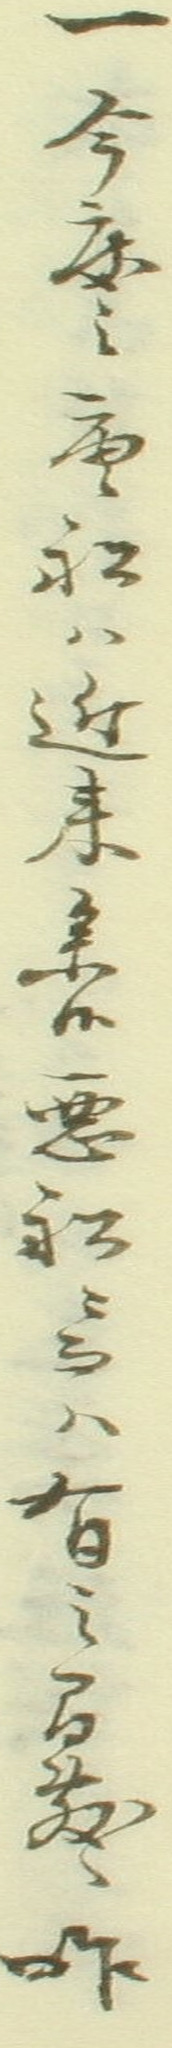一今度之唐船は近来参候悪船に而は有之間敷候昨
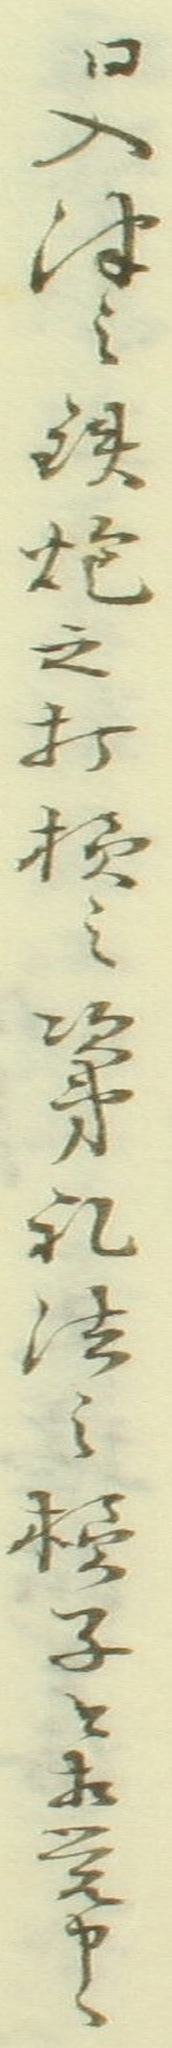日入津之鉄炮之打様之次第礼法之様子と相覚申候
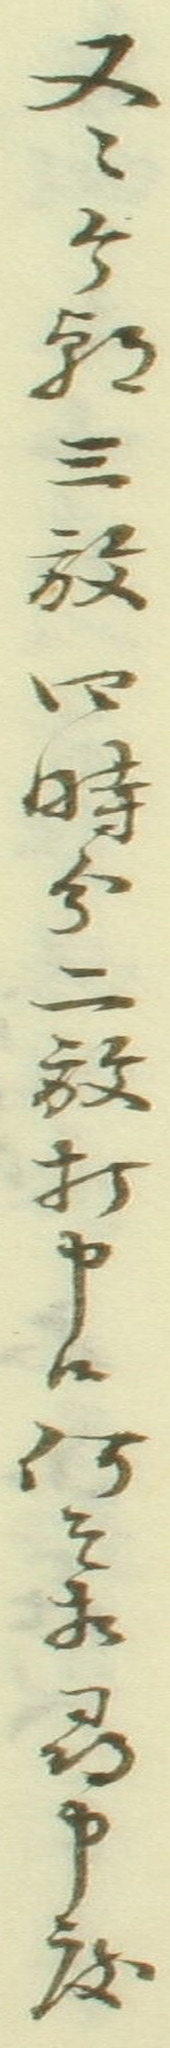又々今朝三放四時分二放打申候何そ相尋申度
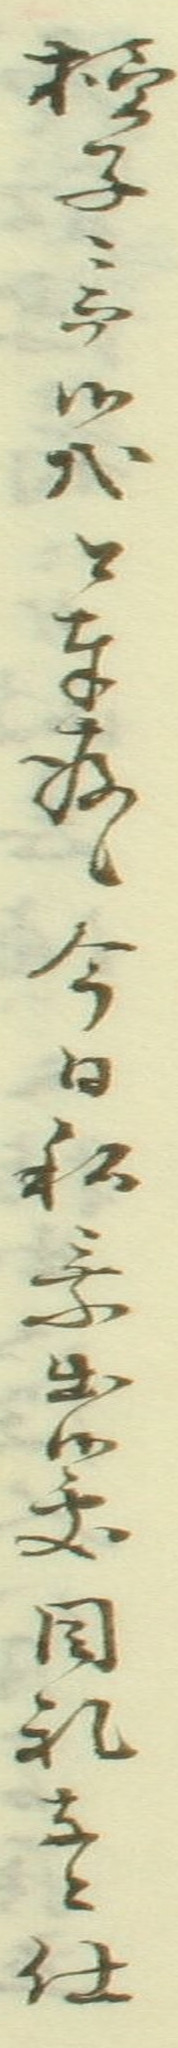様子に而候哉と奉存候今日私乗出候処目礼なと仕
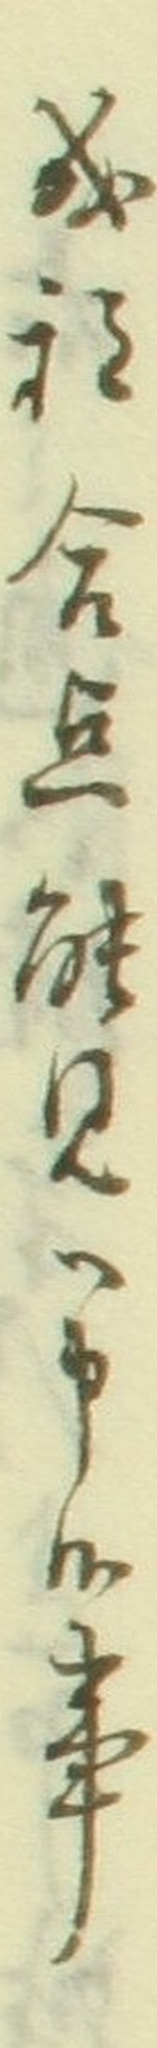成程合点能見へ申候事

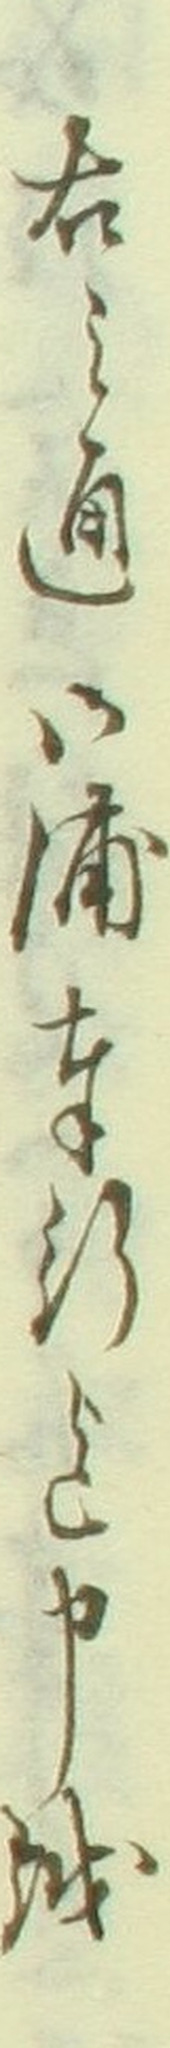右之通御浦奉行迄申越
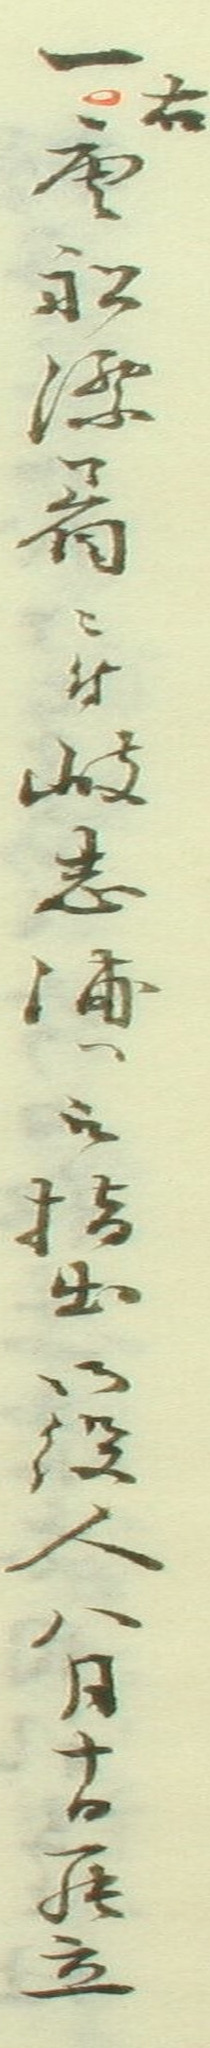一◦唐船漂着に付岐志浦へ被差出御役人八月十日罷立
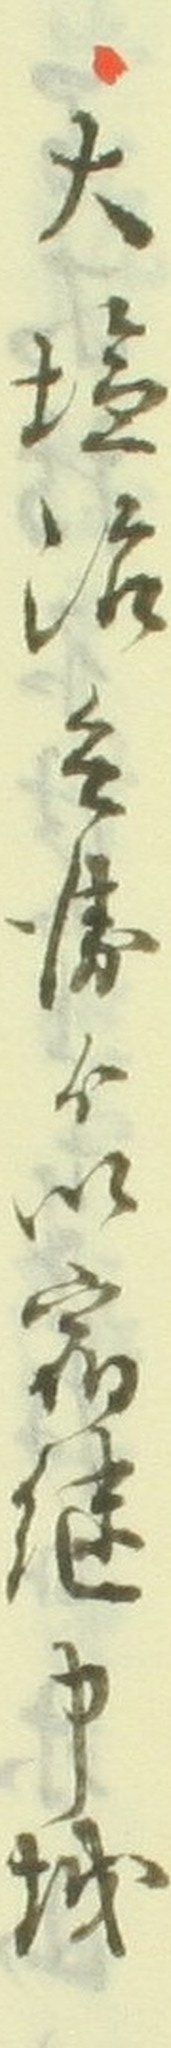大塩治兵衛ゟ以御宿申越
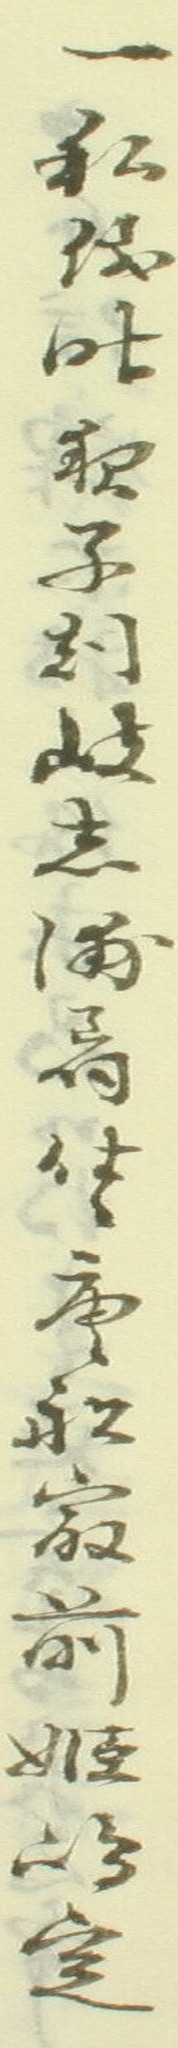一私儀昨夜子刻岐志浦着子仕候唐船最前姫島定
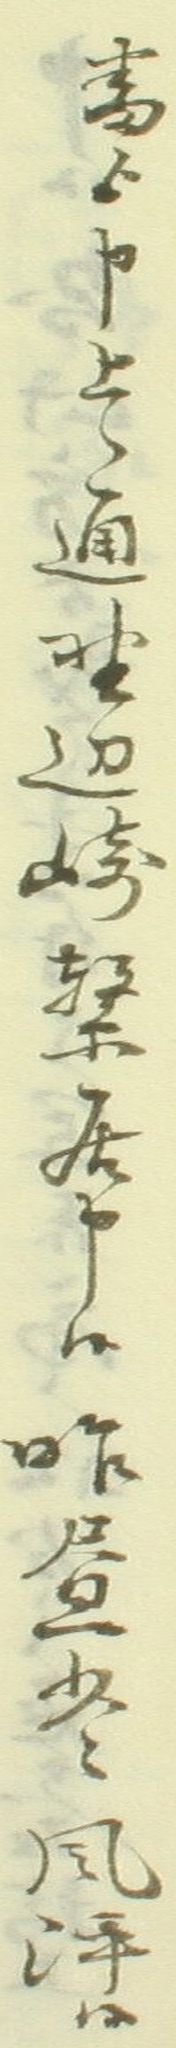番ゟ申上候通野辺崎繋居申候昨昼少々風評に
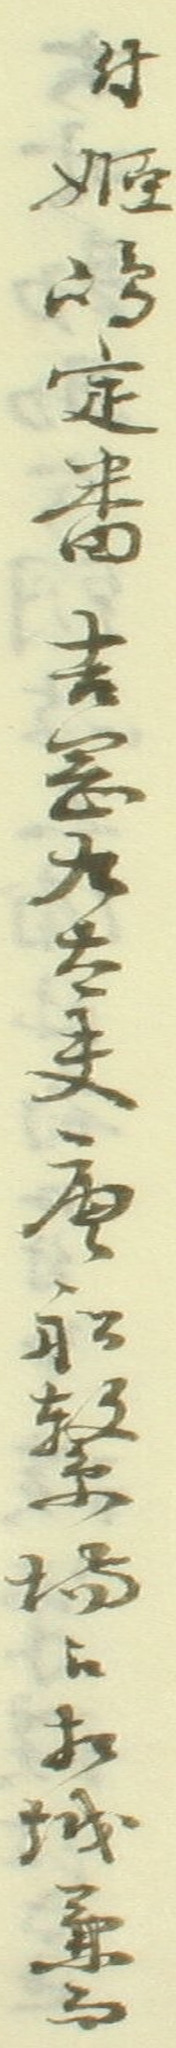付姫島定番吉岡九太夫唐船繋場え相越兼而
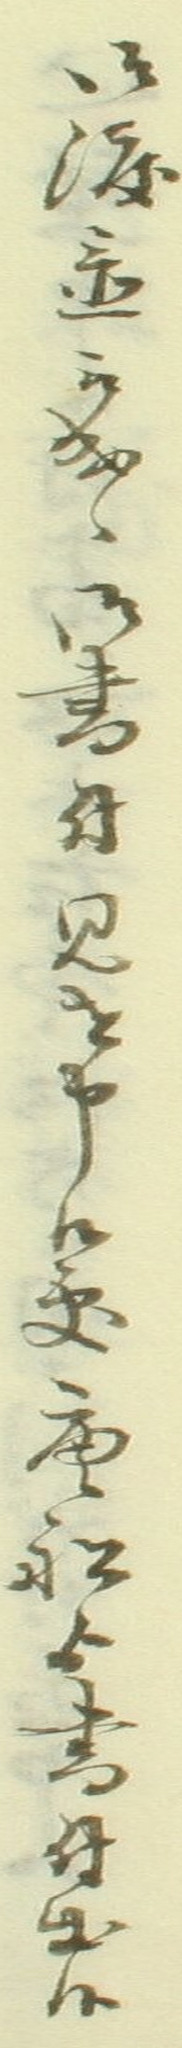御渡置被成候御書付見せ申候処唐船ゟ書付出候
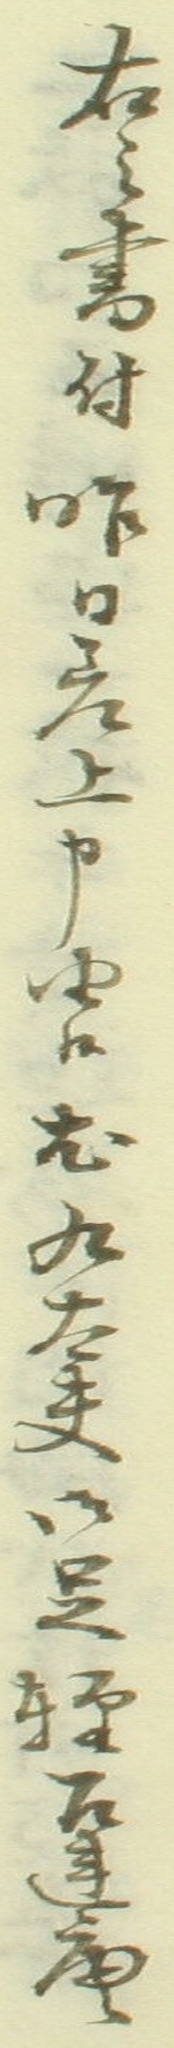右之書付昨日差上申由候尤九太夫御足軽召連唐
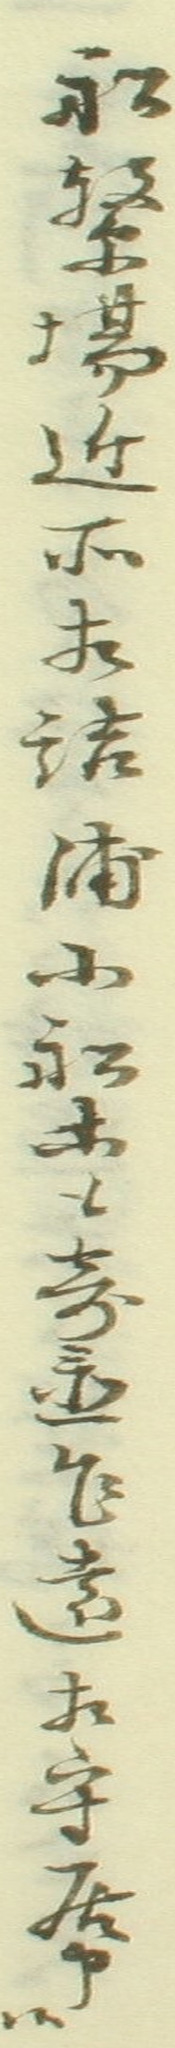船繋場近所相詰浦小船等も寄置乍遠相守居申候
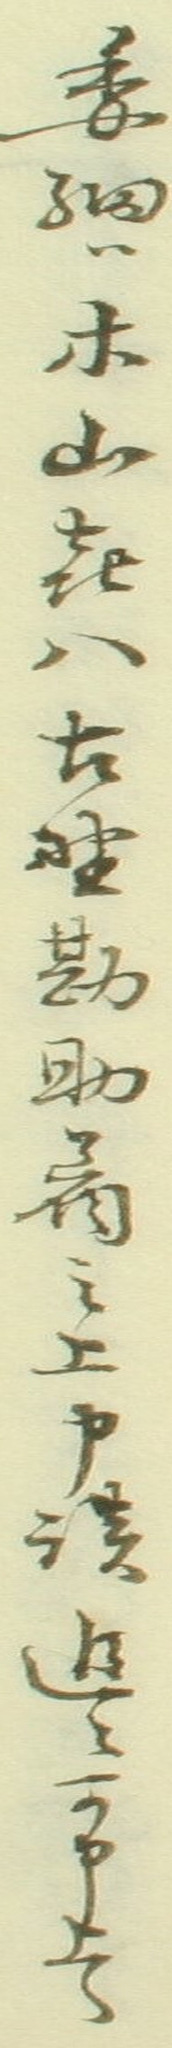委細は木山喜八古野勘助着之上申談追々可申上候
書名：異国船漂着記
